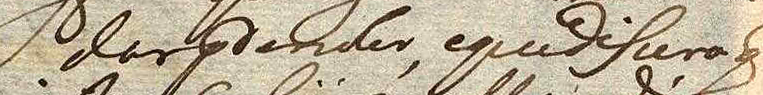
dar prender, e que dissera q̄
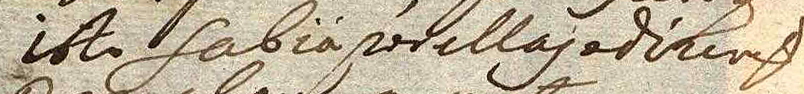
isto sabia por ellas o dizeraõ
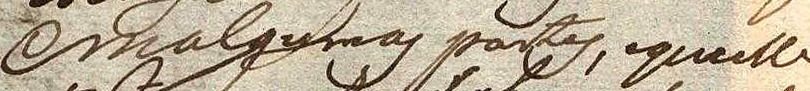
em algumas partes, e que elle
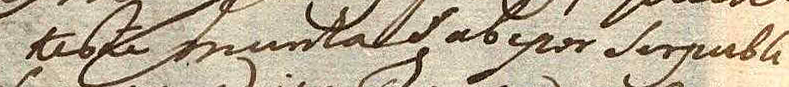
testemunha sabe por ser publi
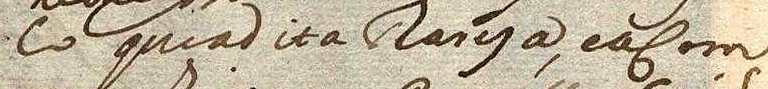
co que a dita Thareza, e a Com
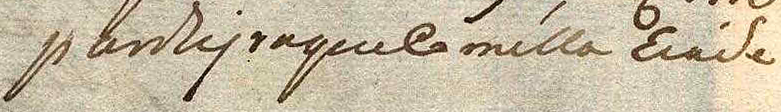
panhejra que com ella hia Se
